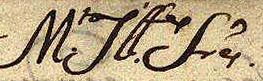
M.to Ill̄.es Srēs.
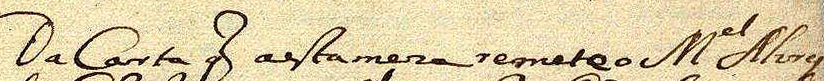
Da Carta q̄ a esta meza remeteo Mel Alures
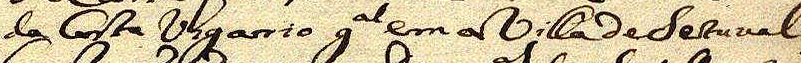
da Costa Vigario gal em a Villa de Setuual
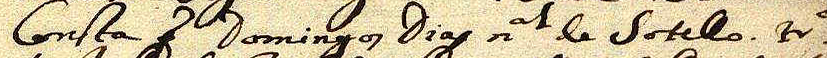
Consta q̄ Domingos Dias nal de Sotello. tro.
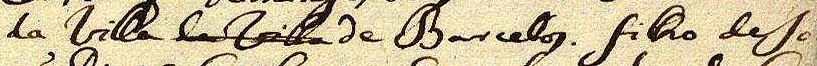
da Villa da Villa de Barcellos filho de Jo
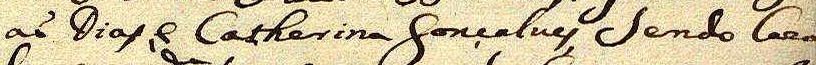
aõ Dias, e Catherina Gonçalues, Sendo Caza
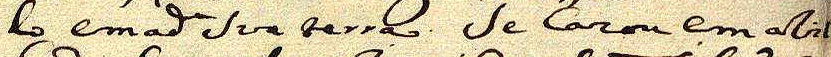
do em a da sua terra. Se Cazou em a Vi
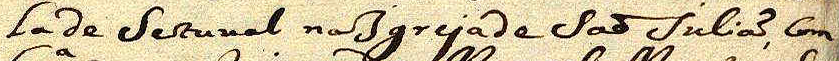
la de Setuual na Igreja de Saõ Iuliaõ, Com
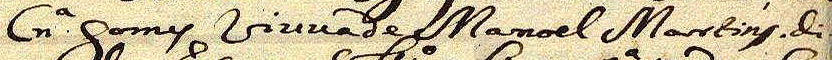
Cn.a Gomes Viuua de Manoel Martins. di
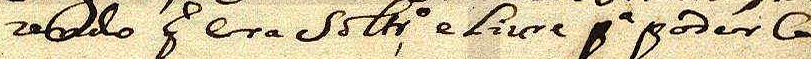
zendo q̄ era Soltro, e livre p.a poder Ca
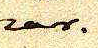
zar.
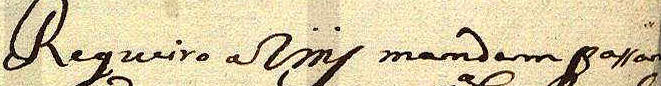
Requeiro a V m̄s mandem passar
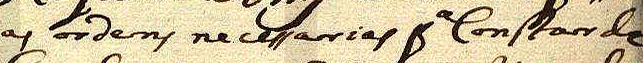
as ordens necessarias pa Constar de
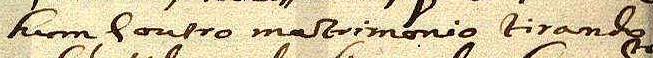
hum e outro matrimonio tirando
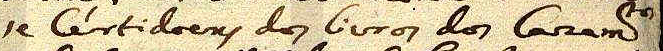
se Certidoens dos liuros dos Cazamtos
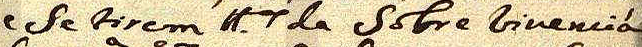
e se tirem tt.as de Sobreviuencia
